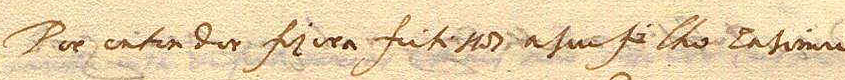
Por entender fizera feitissos a seu filho E asinou
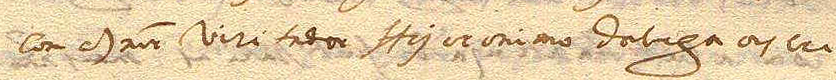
com o Snōr Vizitador Hyeronimo da vega o escre
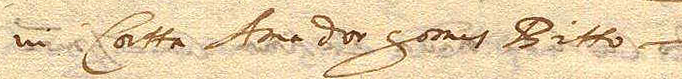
ui Costta Amador gomes Bitto
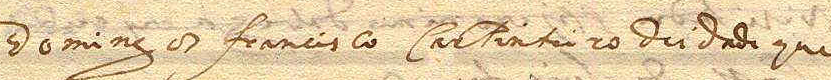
Domingos francisco CarPinteiro de idade que
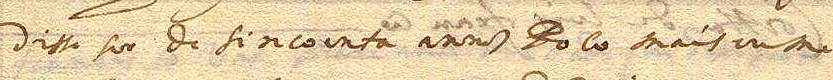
disse ser de sincoenta annos Poco mais ou me
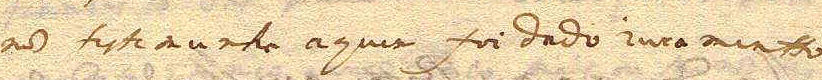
nos testemunha a quem foi dado iuramentto
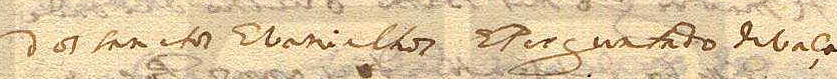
dos sanctos Evanielhos E Perguntado devaça
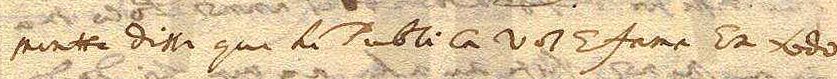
mentte disse que he Publica voz E fama Em todo
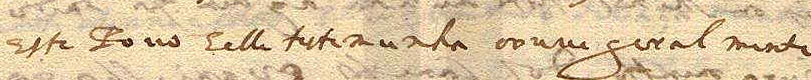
Este Pouo E elle testemunha o ouue geralmente
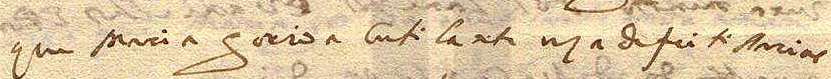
que Maria gorioa cutilante uza de feitissarias
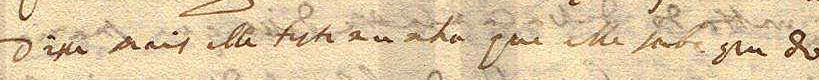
Disse mais elle testemunha que elle sabe que do
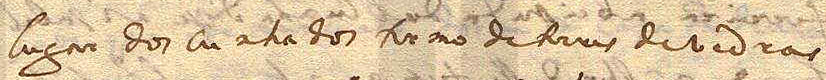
lugar dos cunhados termo de torres de vedras
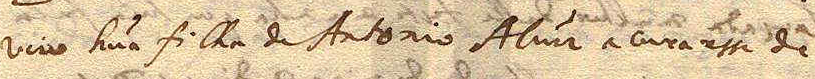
veio huā filha de Antonio Alurs̄ a curarsse de
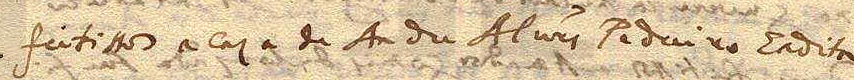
feitissos a caza de Andre Alurs̄ Pedreiro E a dita
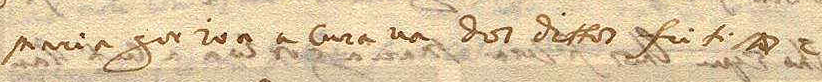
Maria gorioa a curaua dos dittos feitissos E
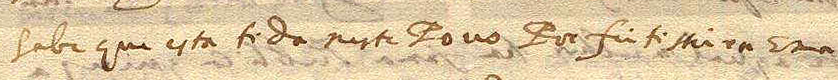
sabe que esta tida neste Pouo Por feitissiera E ma
